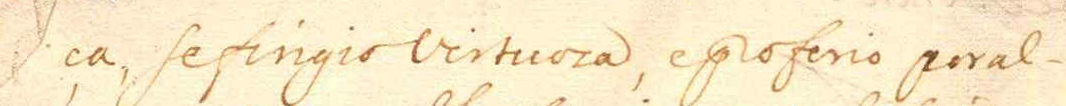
ça, se fingio virtuoza, e proferio por al
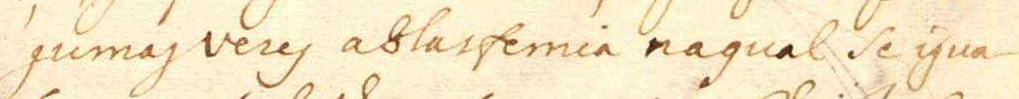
gumas vezes a blasfemia na qual se igua
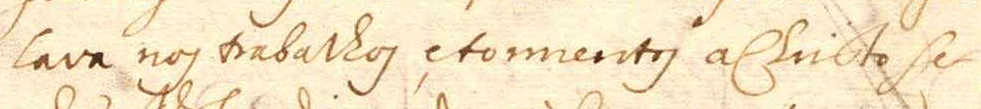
lava nos trabalhos e tormentos a Christo se
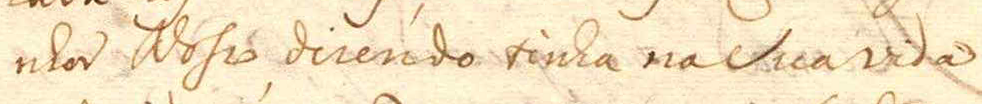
nhor Nosso dizendo tinha na sua vida
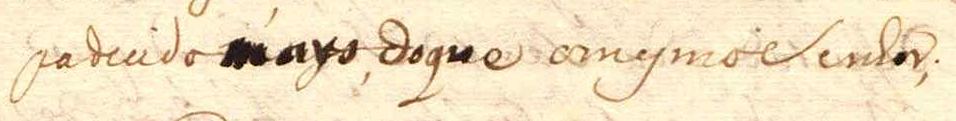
padecido mays, do que o mesmo Senhor;
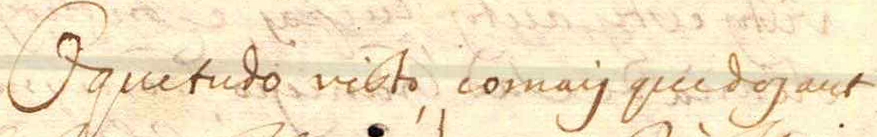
O que tudo visto e o mais que dos aut
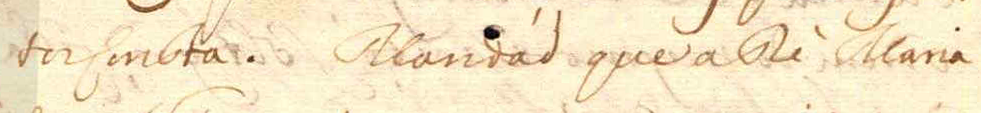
tos Consta. Mandaõ que a Ré Maria
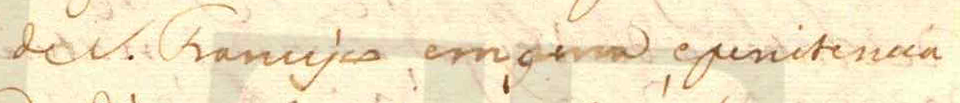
de S. Francisco emcina, e penitencia
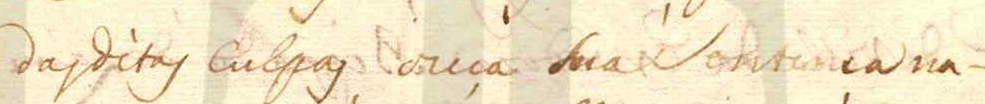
das ditas Culpas, ouça sua Sentença na
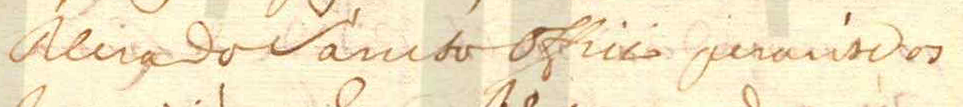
Meza do Sancto officio perante os
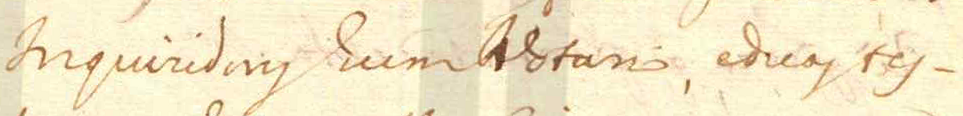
Inquizidores hum Notario, e duas tes
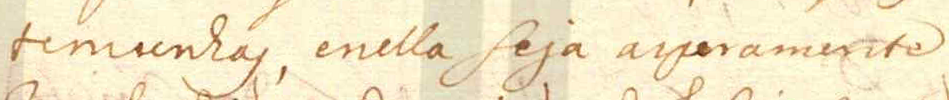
temunhas, e nella seja asperamente
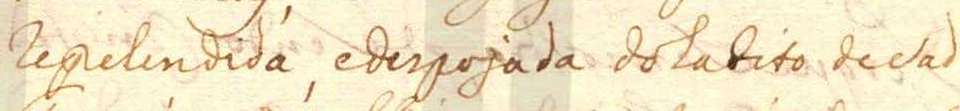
Repehendida, e despojada do habito de Saõ
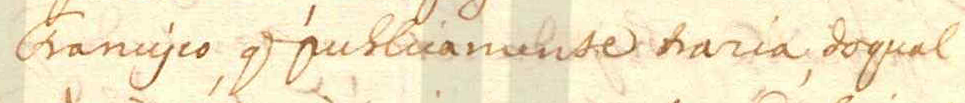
Francisco, q̄ publicamente trazia, do qual
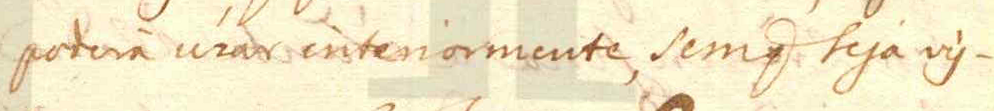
poderá uzar interiormente, sem q̄ seja vis
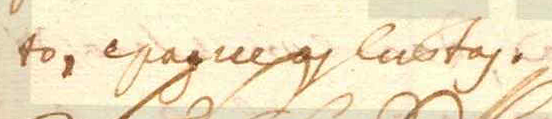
to, e pague as Custas.
